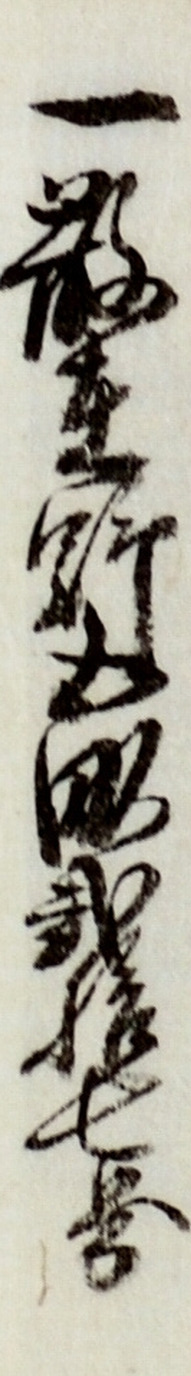一散在野五畝弐拾七歩
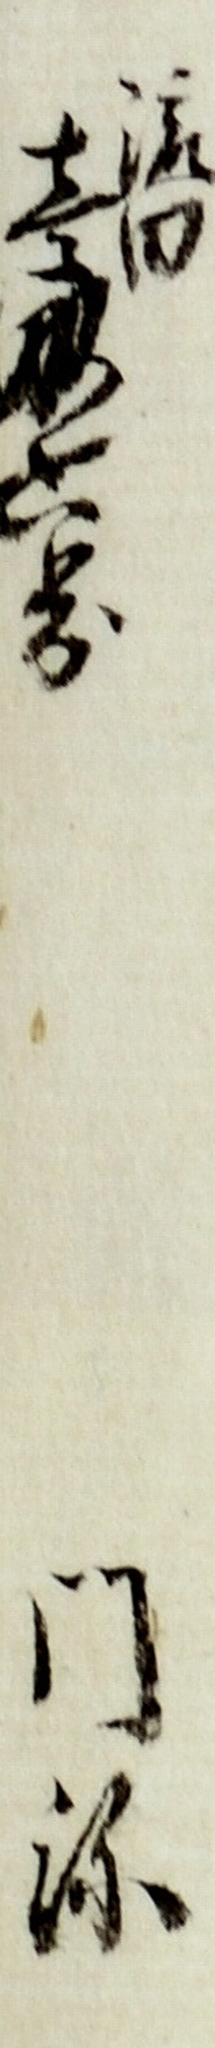壱畝六歩門弥
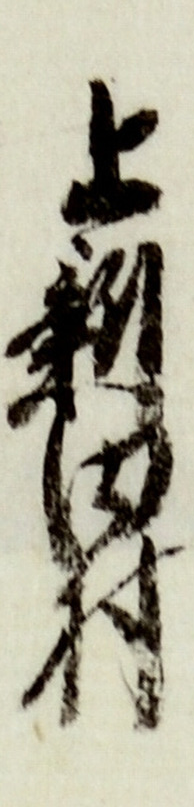上新田村
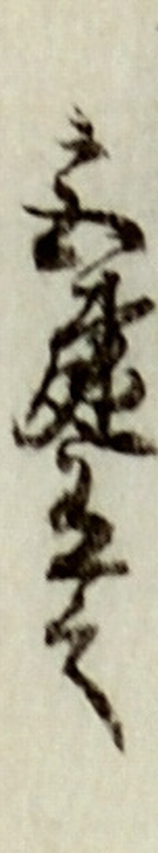宮建有之
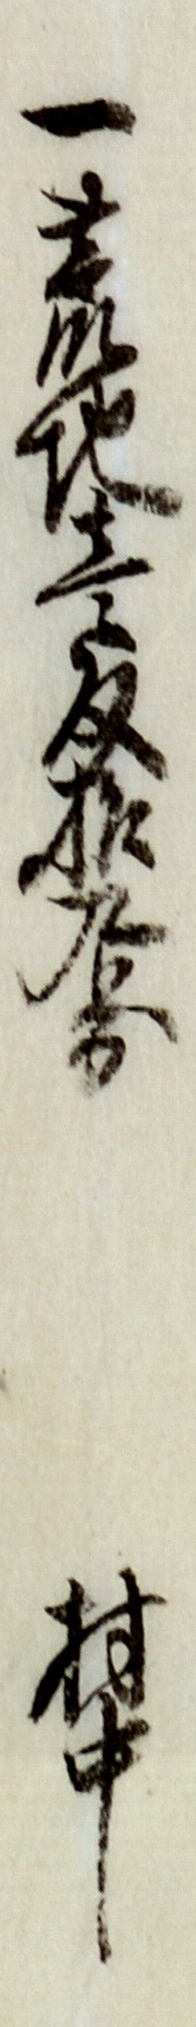一荒地壱反拾九歩村中
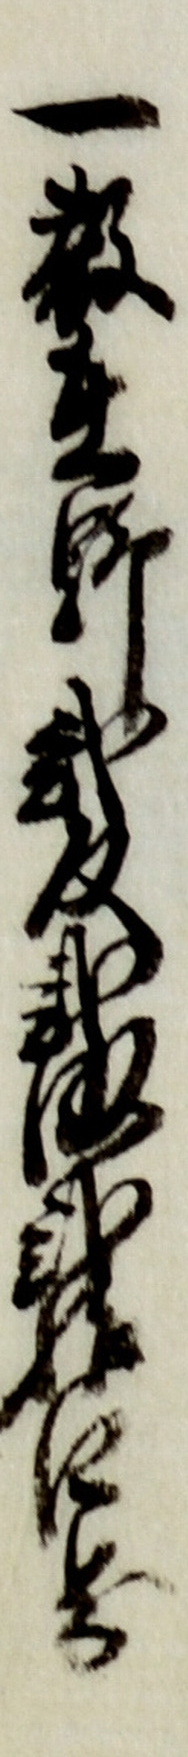一散在野弐反弐畝弐拾四歩

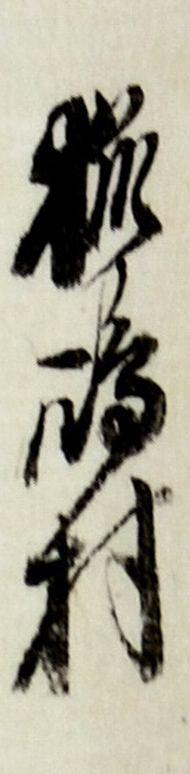狐島村
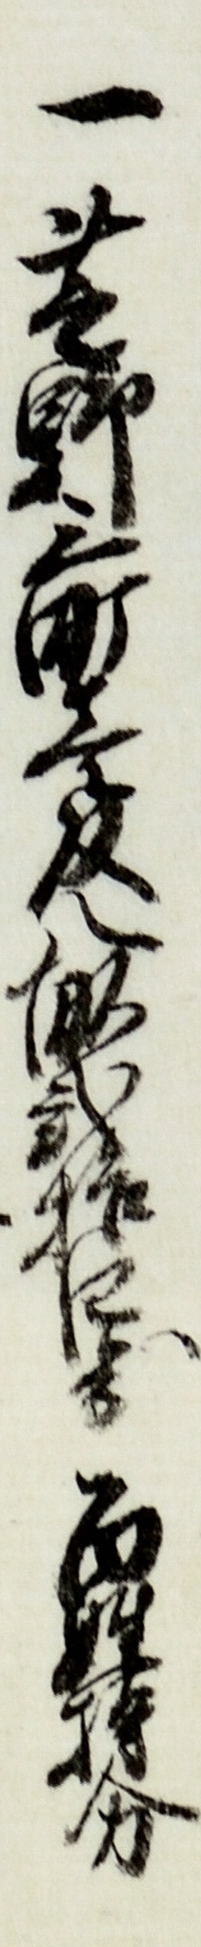一芝野三町壱反八畝弐拾四歩百姓持分
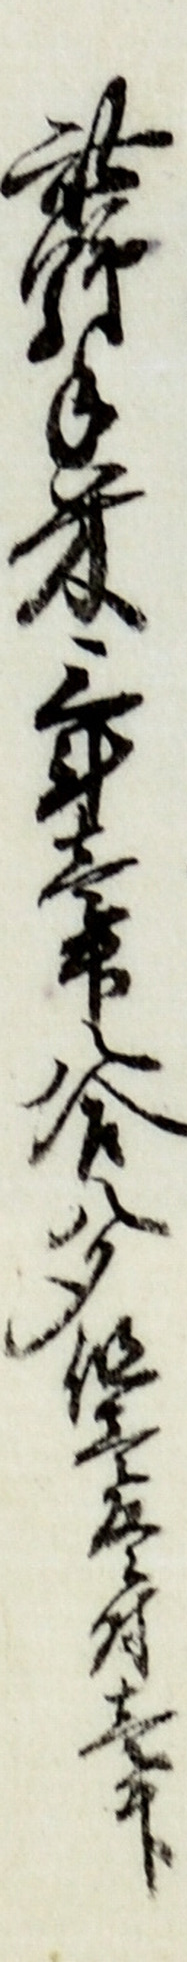此野手米三斗壱升八合八勺但壱反ニ付壱升

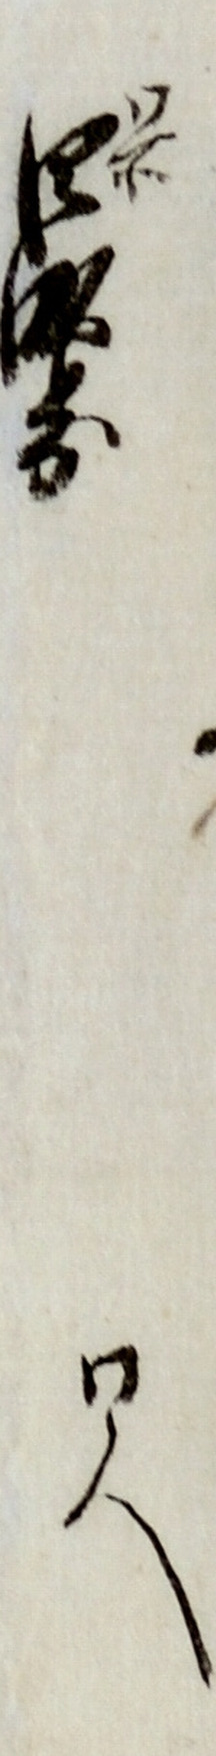四畝歩同人
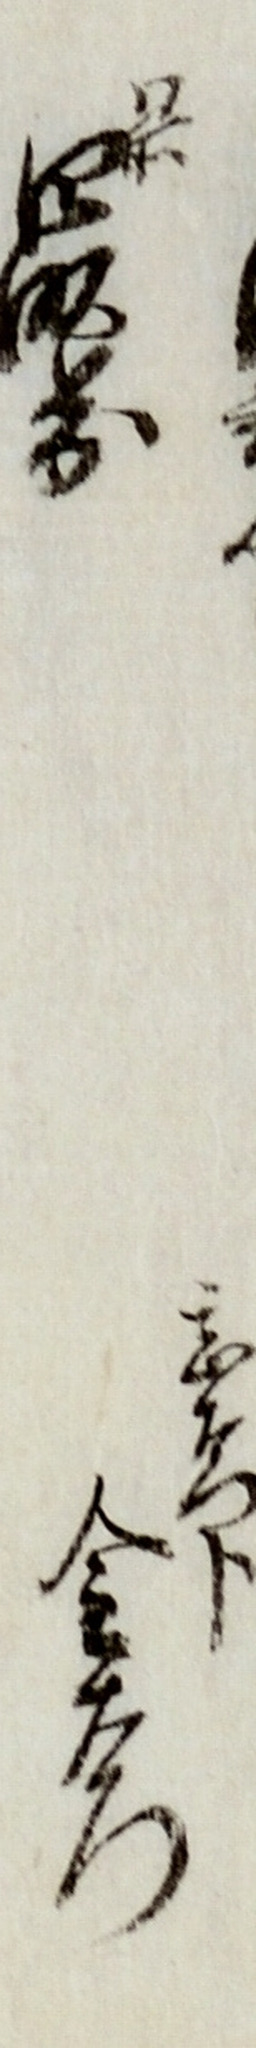四畝歩金右衛門
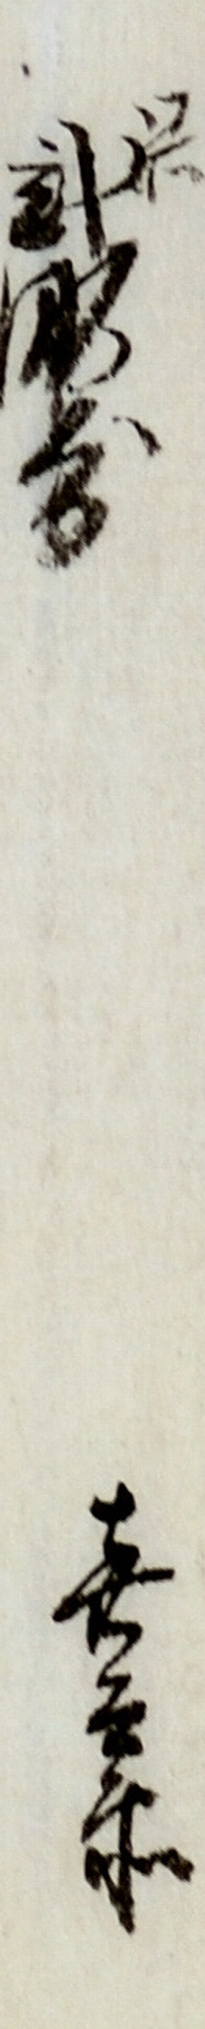弐畝歩喜兵衛
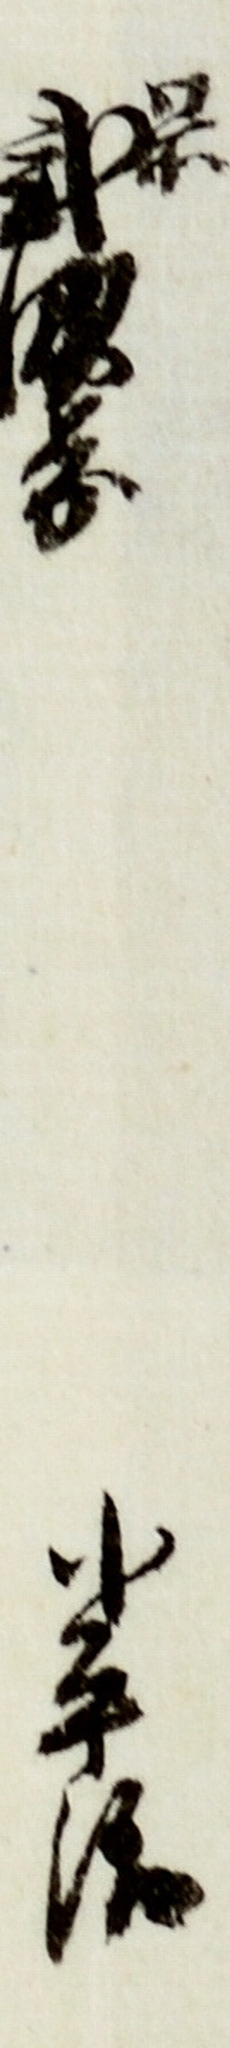弐畝歩小平治

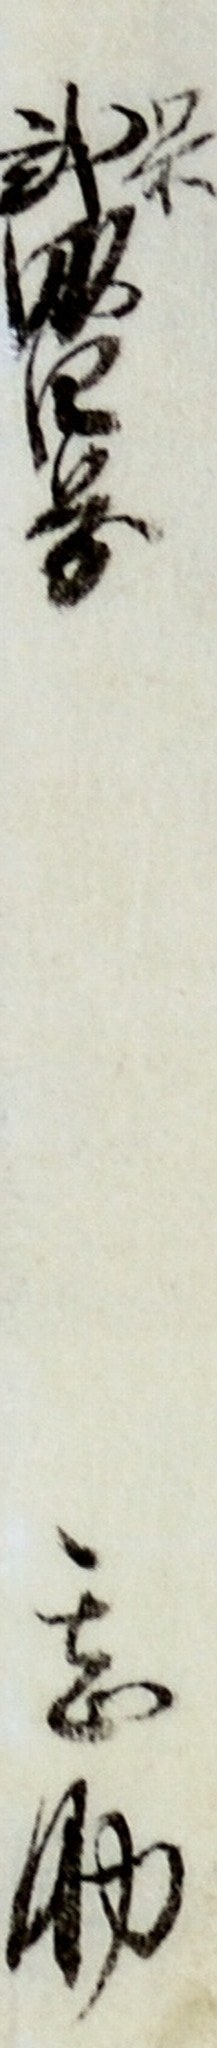弐畝四歩甚助
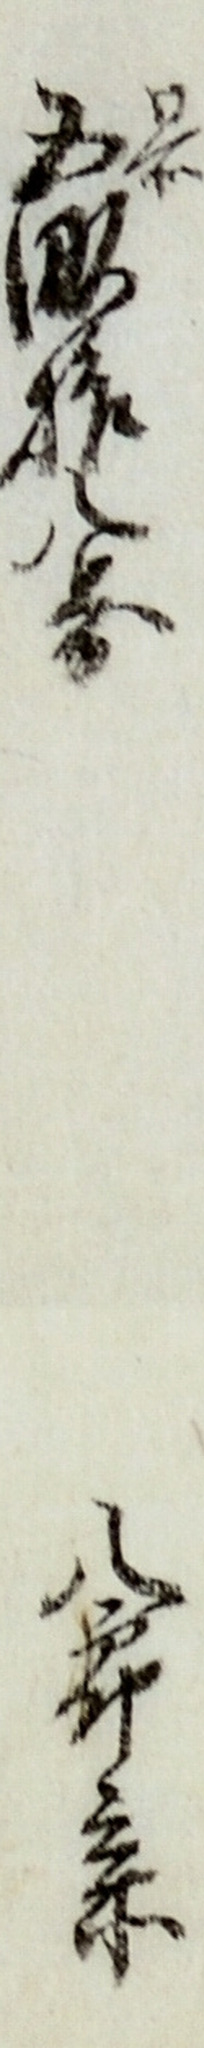五畝拾八歩八郎兵衛
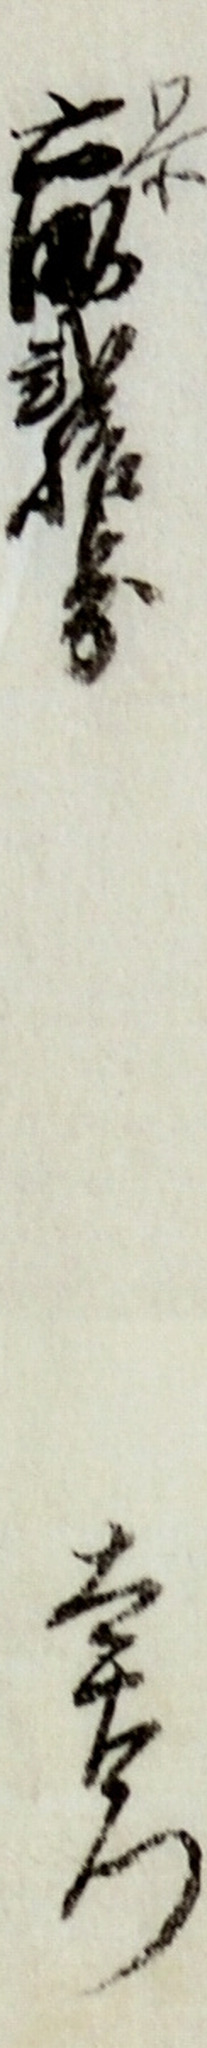六畝弐拾歩太右衛門
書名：御領分中山林社地手控
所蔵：伊那市立高遠町図書館・合同会社AMANE
